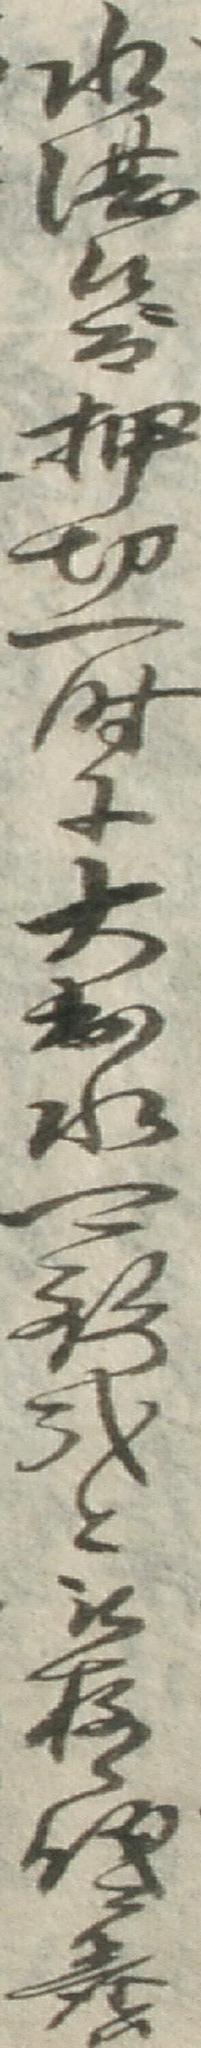水湛候二而押切一時に大出水可致哉と被存候儀二御座候
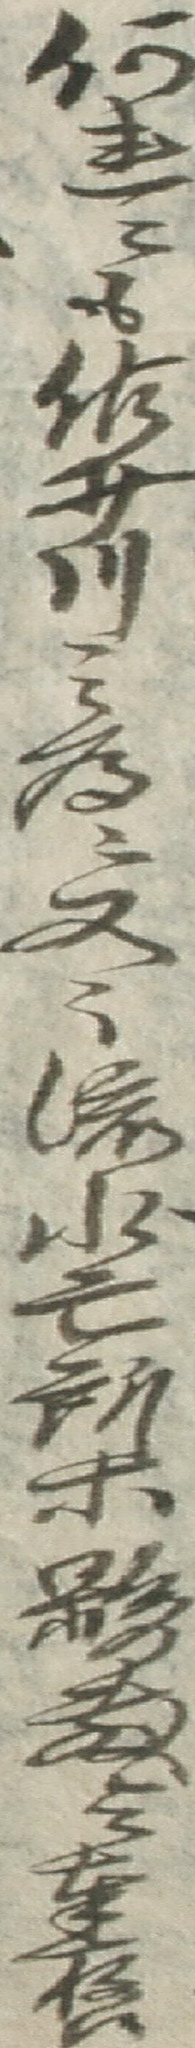何れ二も左井川之為二又々流水亡所等夥敷と奉存候
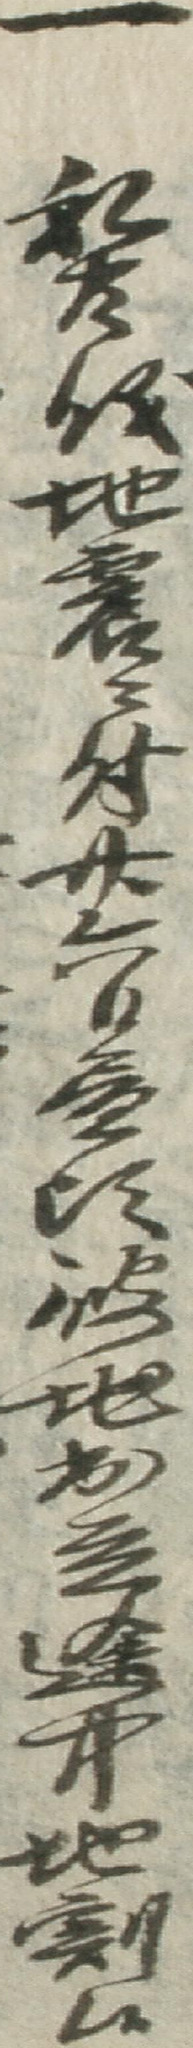一私共儀地震二付廿六日昼頃彼地出立途中地割候
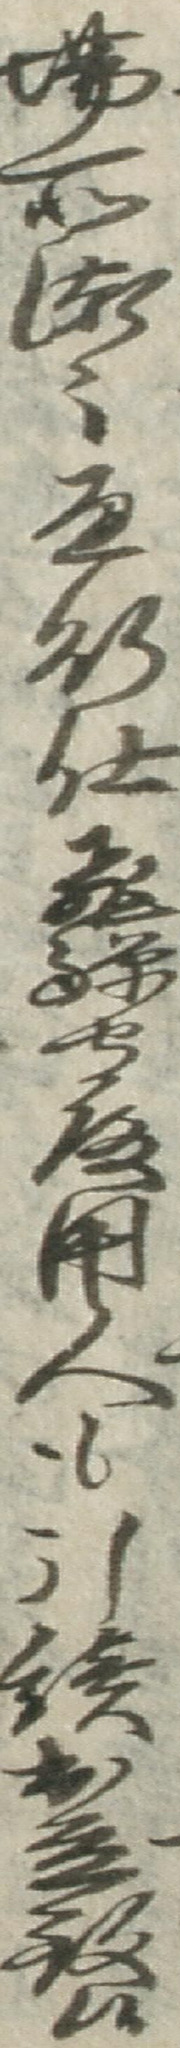場所漸々通行仕飛騨守殿用人も引続出立致候
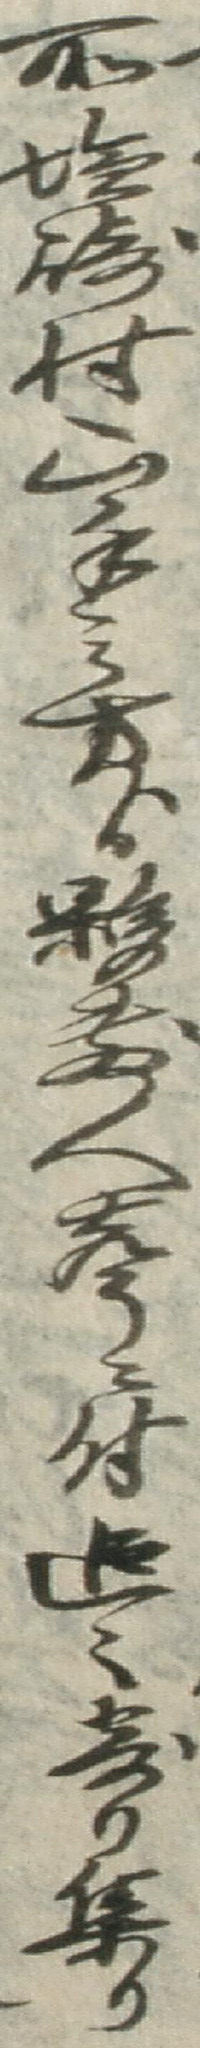所塩崎村山手之方ゟ夥敷人声二付追々寄り集り
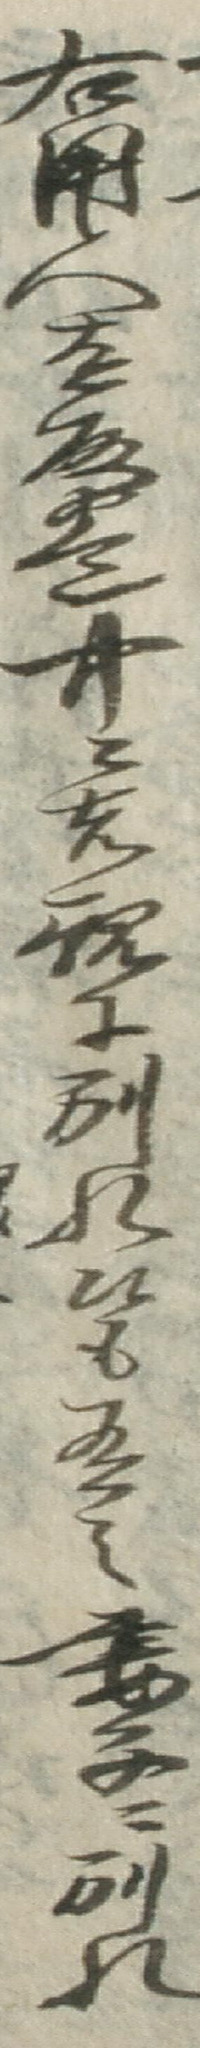右用人を取巻中二は親子別れ候も有之妻子二別れ
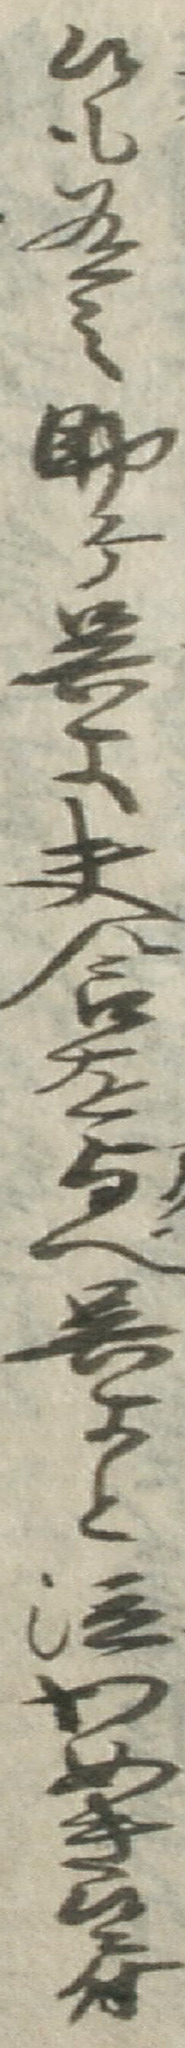候も有之助ヶ呉よ夫合を与へ呉よと泣わめき候二付
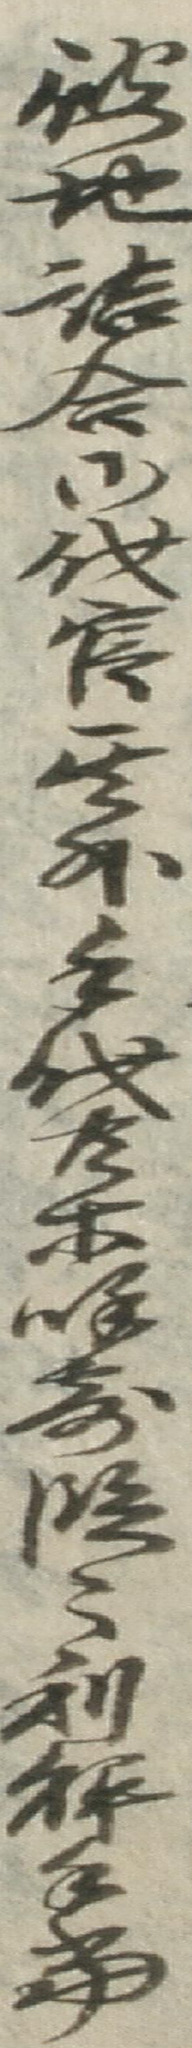彼地詰合御代官其外手代共等呼寄段々利解手当
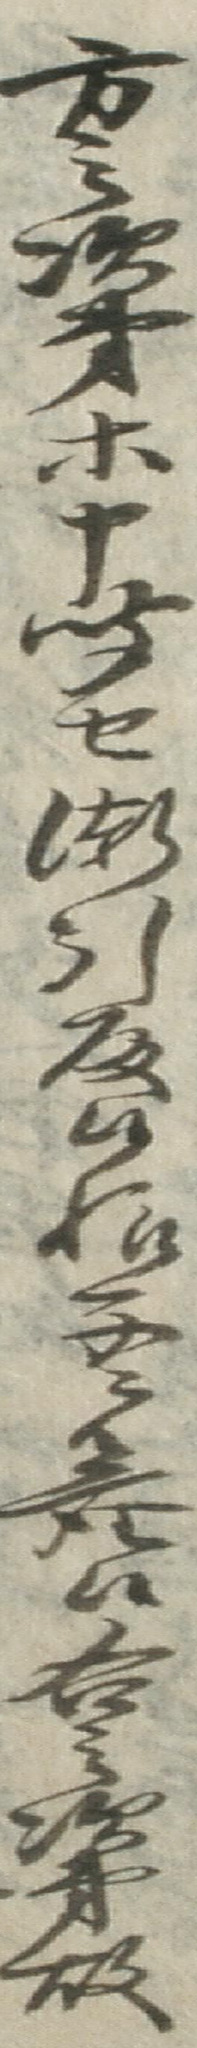方之次第等申聞セ漸引取候様子二御座候右之次第故
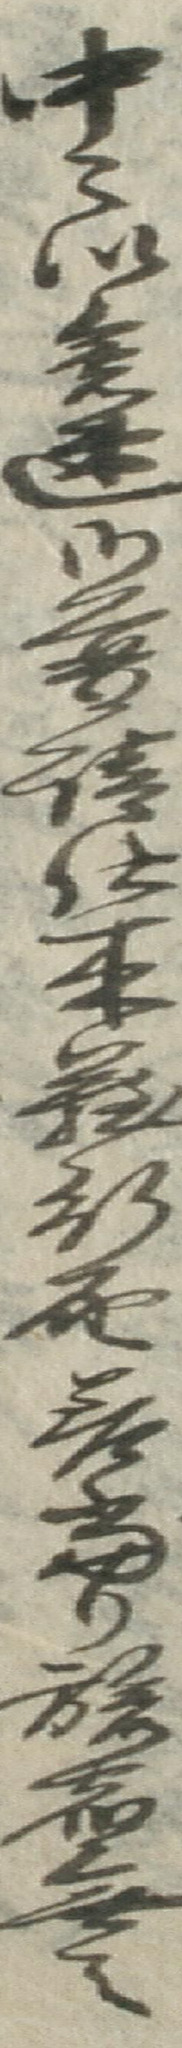中々以急速御普請仕来難行届差当り旅宿無之
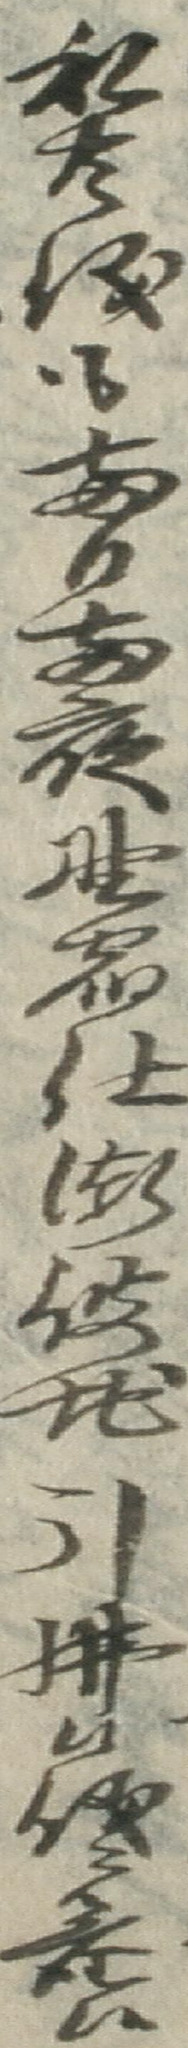私共儀も両日両夜野宿仕漸彼地引払候儀二御座候
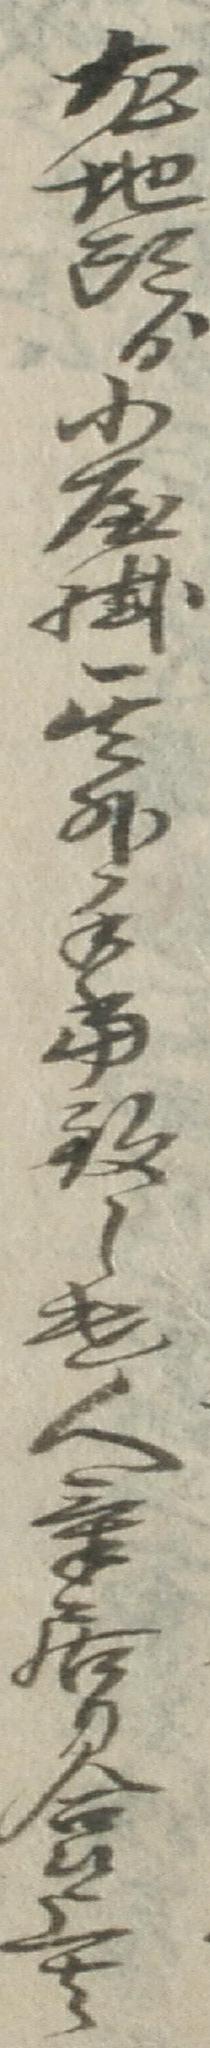尤地頭ゟ小屋掛其外手当致し遣人気居り合候上は
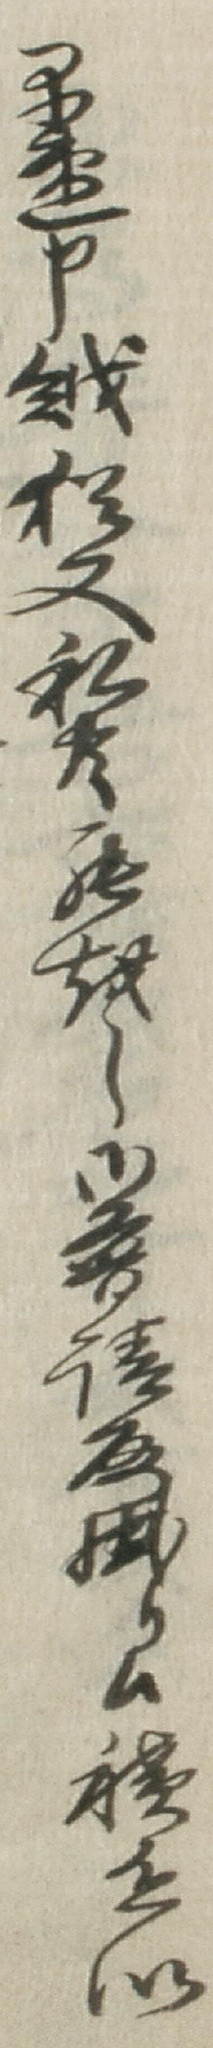早速可申越猶又私共罷越申候御普請取掛候積を以
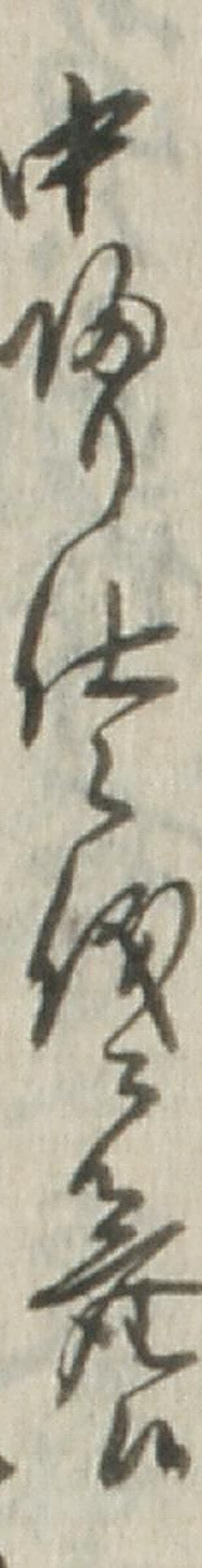中帰り仕候儀二御座候
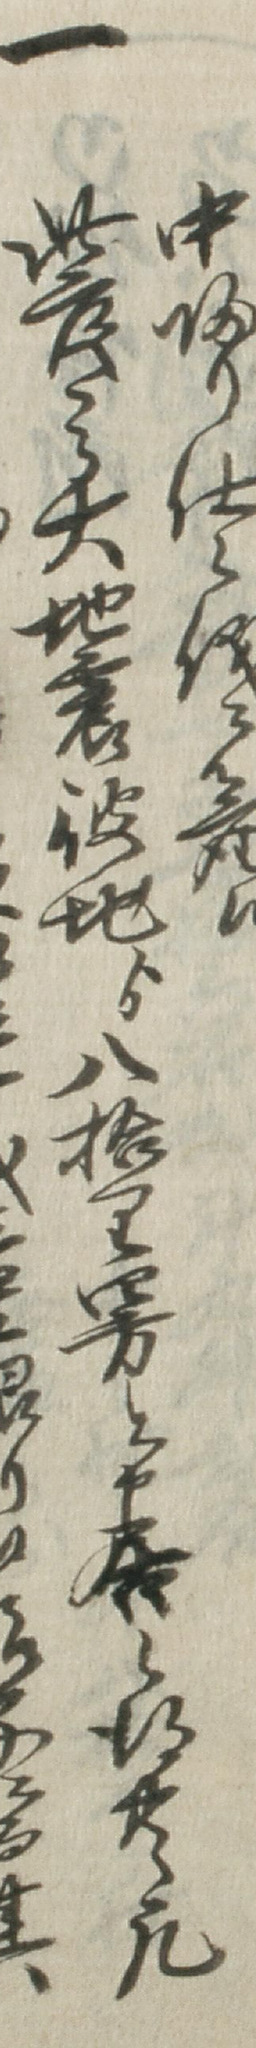一此度之大地震彼地ゟハ拾里四方申居候得共凡
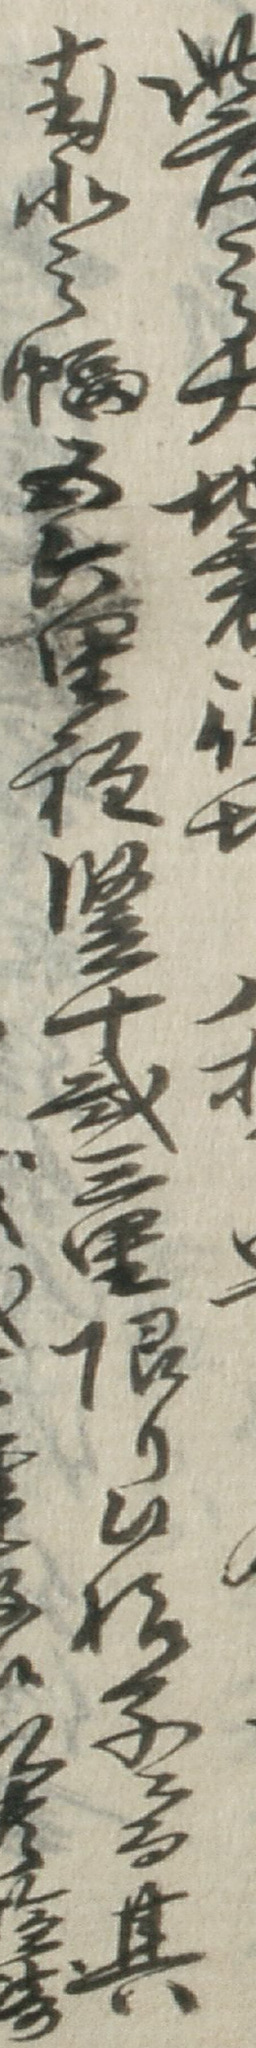南北之幅五六里程竪拾弐三里限り候様子二而其
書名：信濃國地震實録記
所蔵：東京大学地震研究所図書室 Earthquake Research Institute Library, The University of Tokyo, JAPAN
